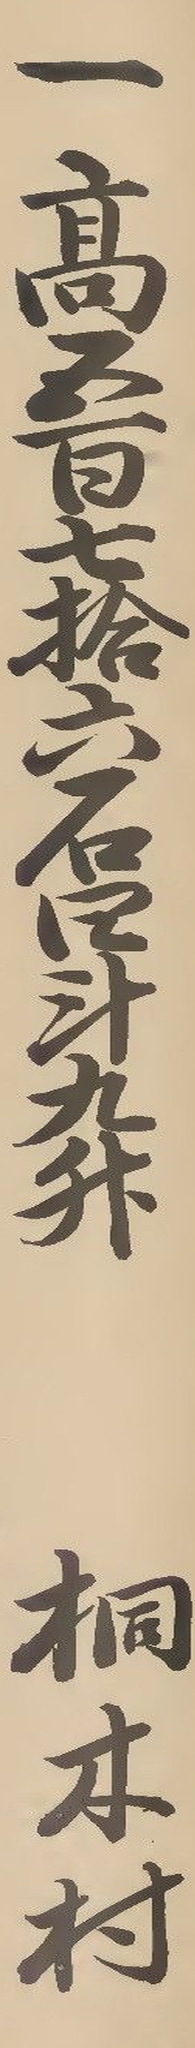一高五百七拾六石四斗九升桐木村
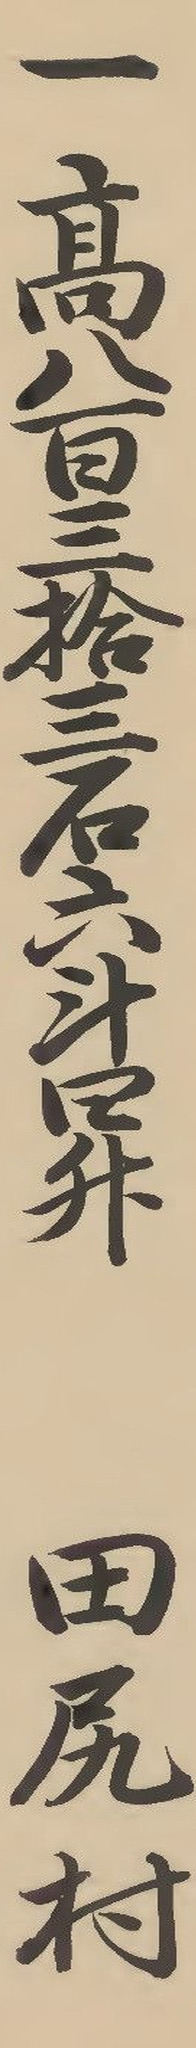一高八百三拾三石六斗四升田尻村
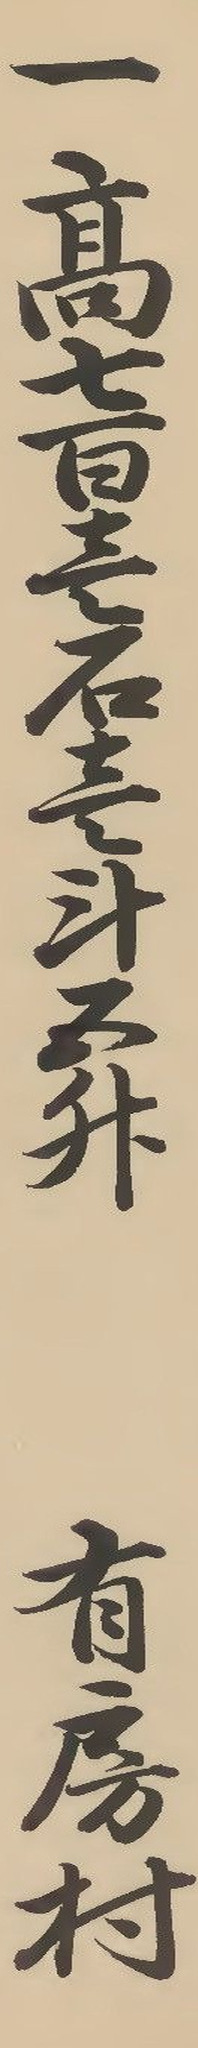一高七百壱石壱斗五升有房村
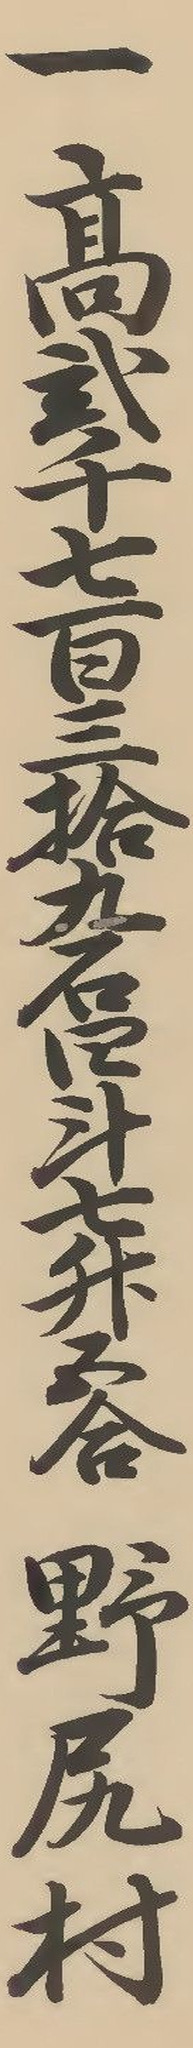一高弐千七百三拾九石四斗七升五合野尻村

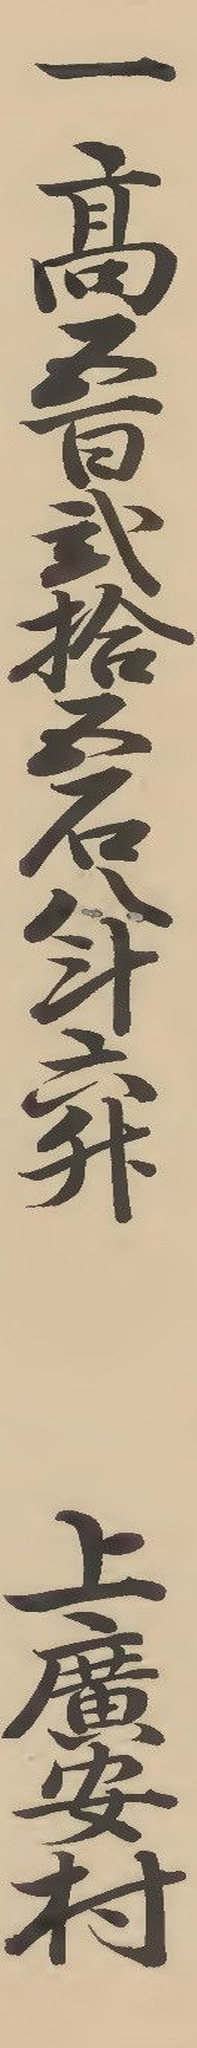一高五百弐拾五石八斗六升上広安村
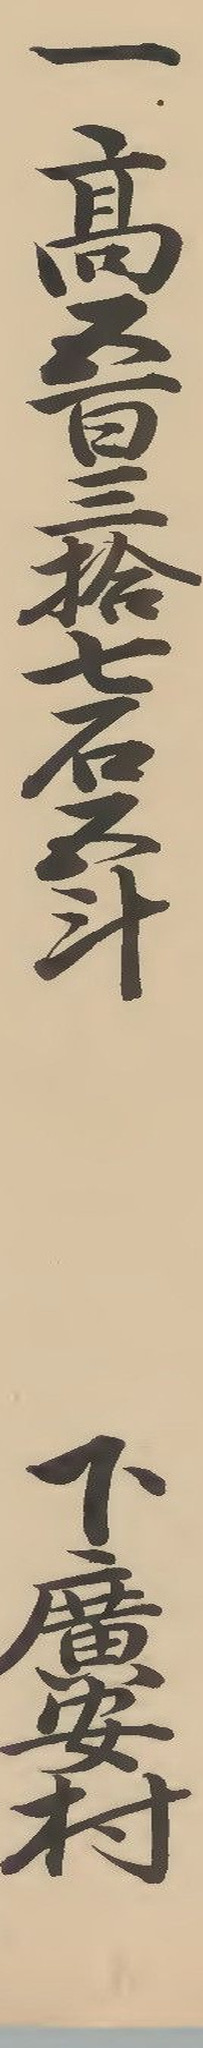一高五百三拾七石五斗下広安村
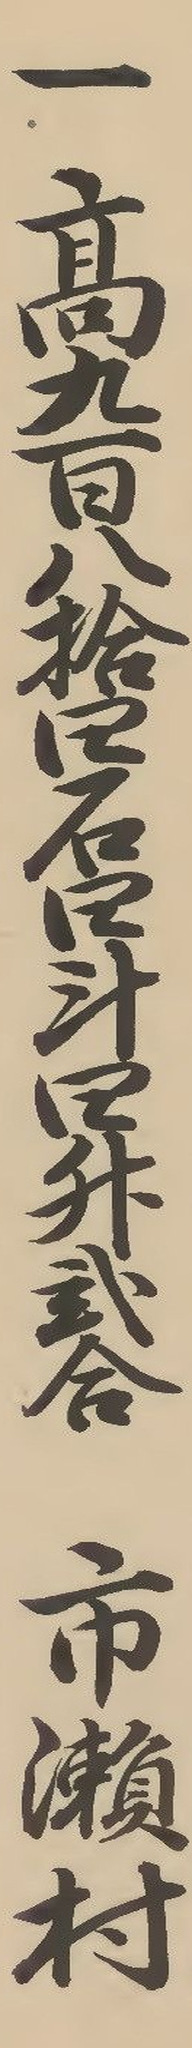一高九百八拾四石四斗四升弐合市瀬村
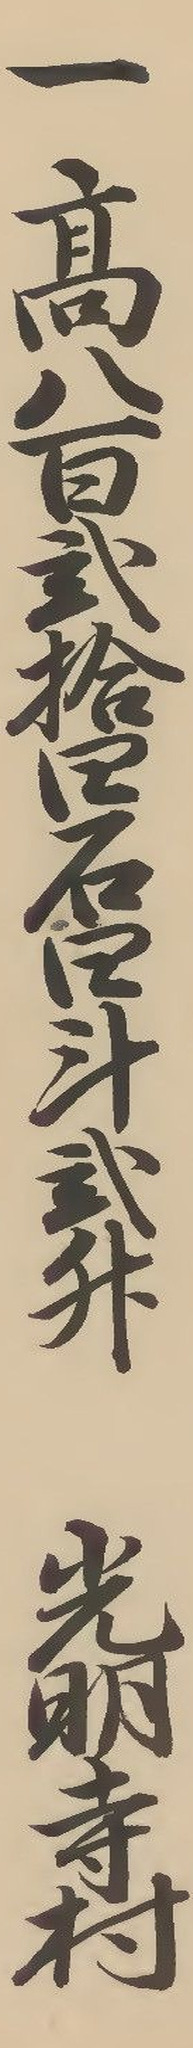一高八百弐拾四石四斗弐升光明寺村

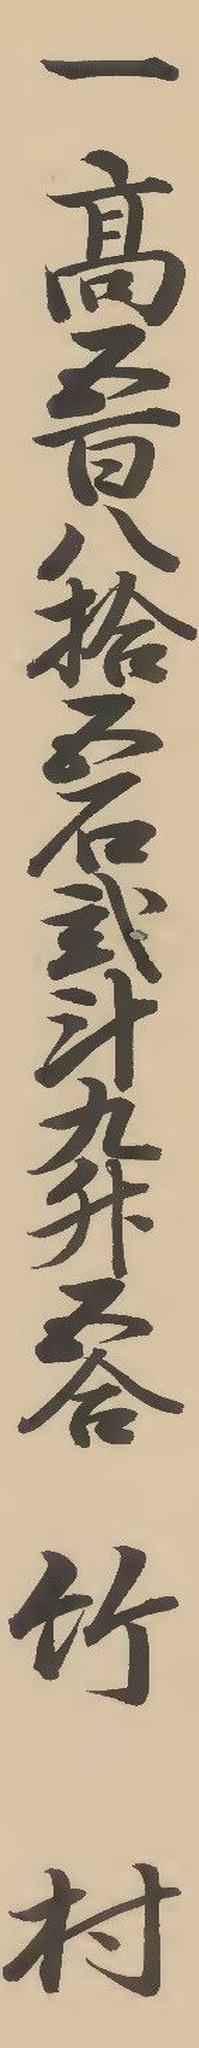一高五百八拾五石弐斗九升五合竹村
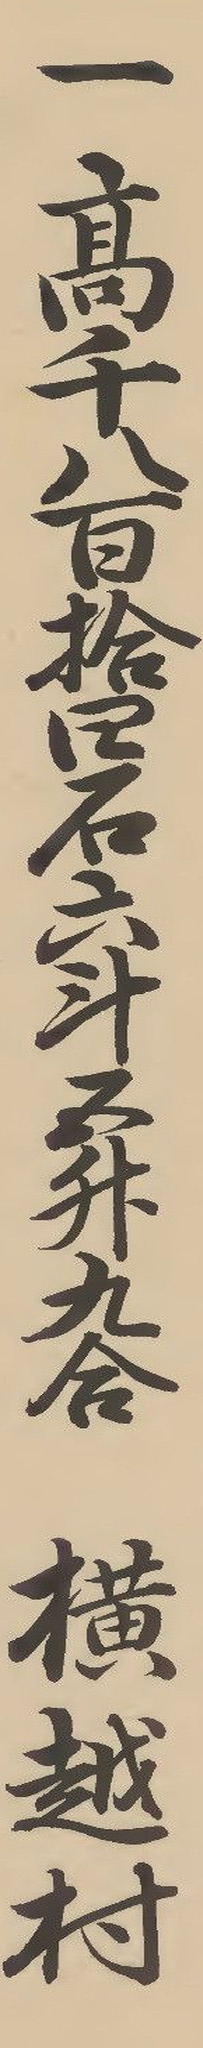一高千八百拾四石六斗五升九合横越村
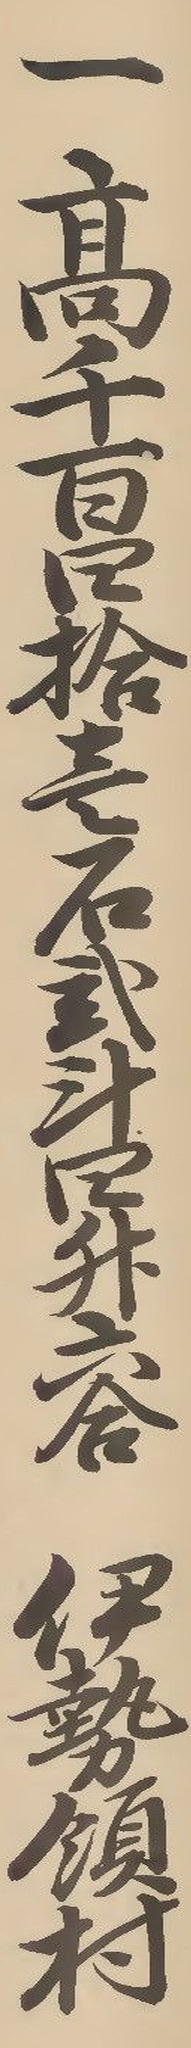一高千百四拾壱石弐斗四升六合伊勢領村
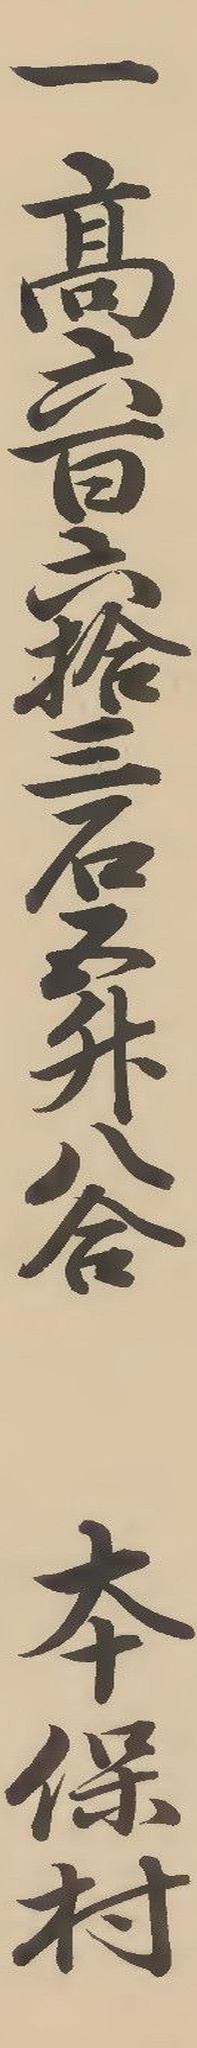一高六百六拾三石五升八合本保村
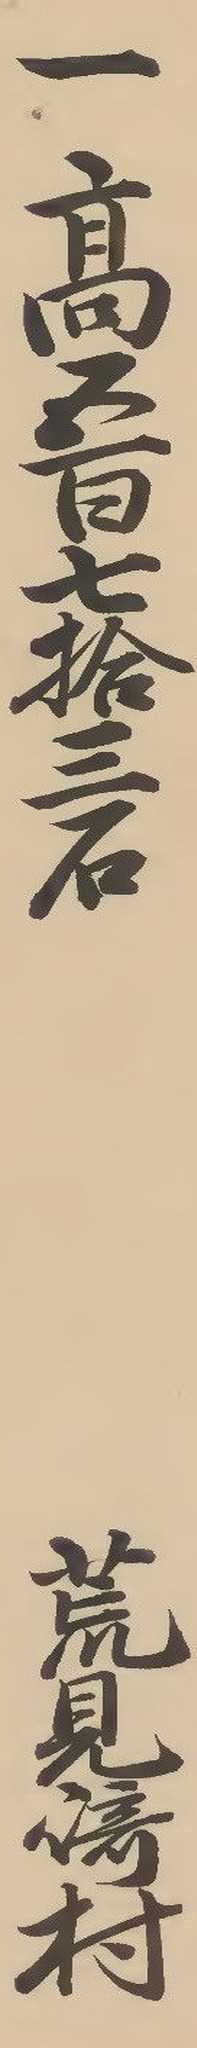一高五百七拾三石荒見崎村
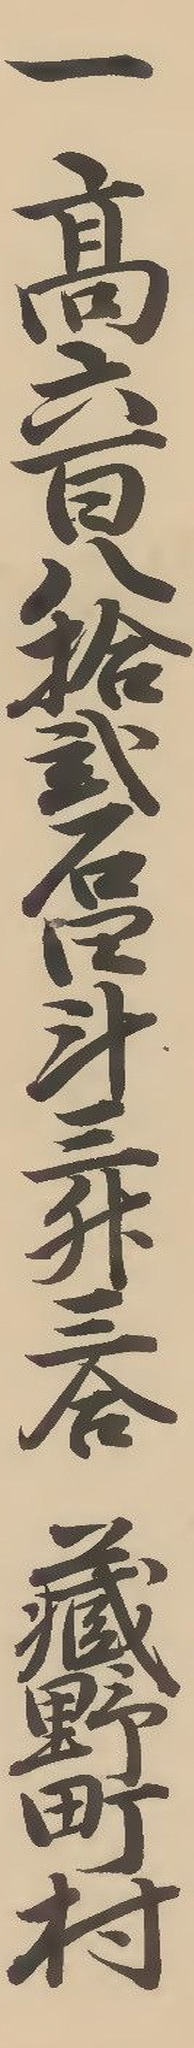一高六百八拾弐石四斗三升三合蔵野町村

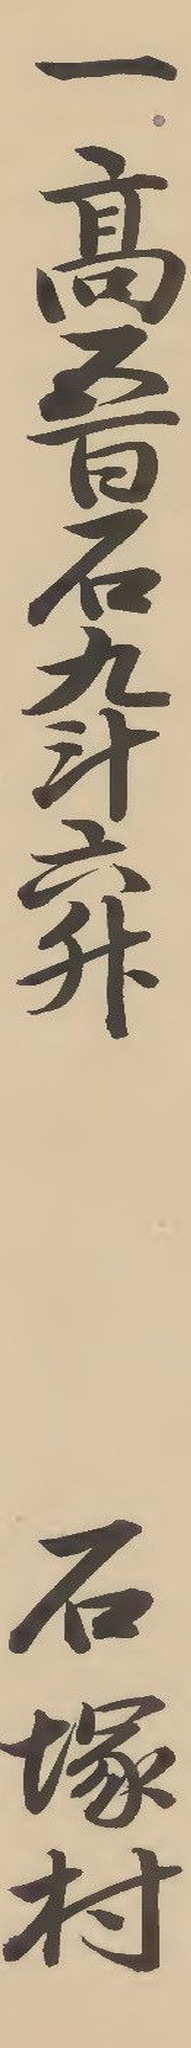一高五百石九斗六升石塚村
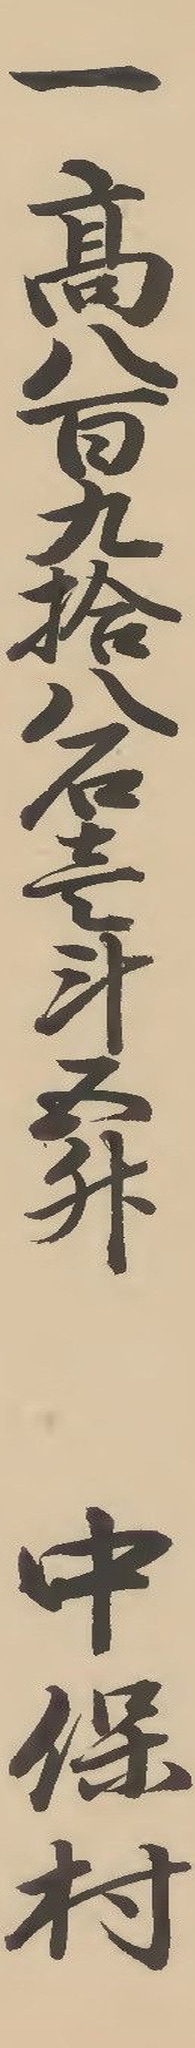一高八百九拾八石壱斗五升中保村
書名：越中国郷帳
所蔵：国立公文書館 National Archives of Japan
